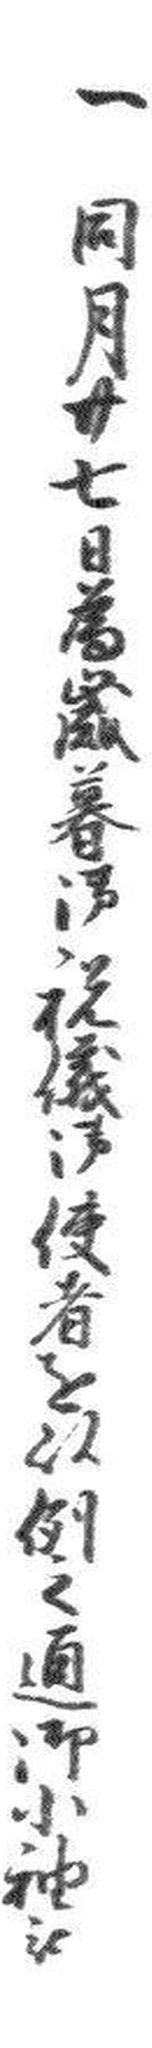一同月廿七日為歳暮御祝儀御使者を以例之通御小袖被
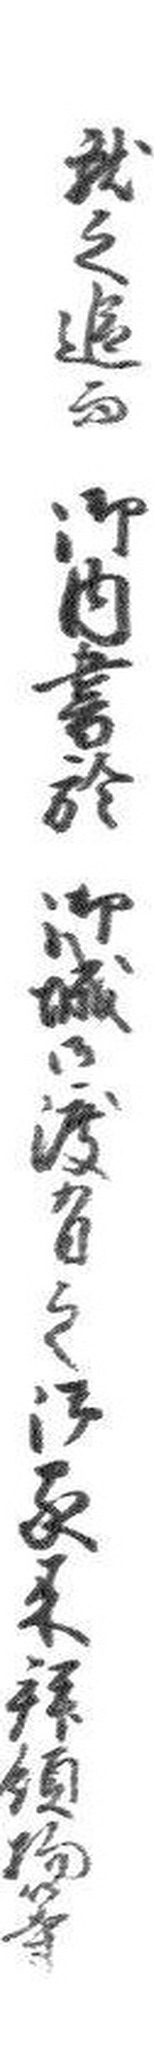献之追而御内書於御城御渡有之御家来拝領物等

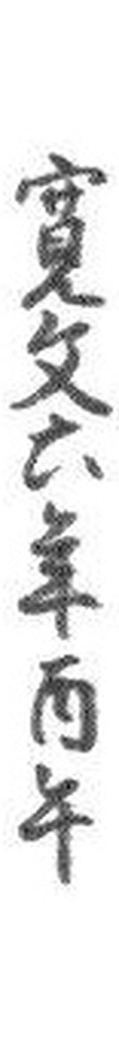寛文六年丙午
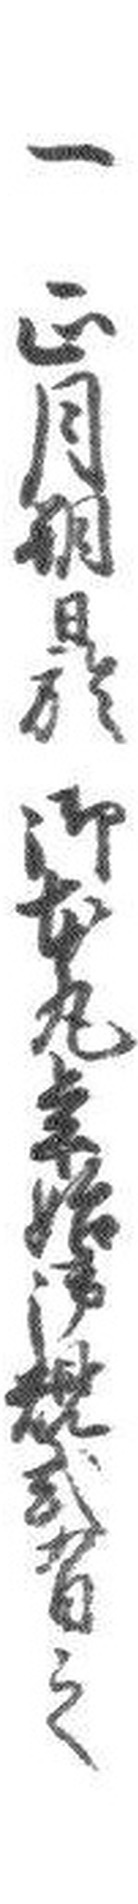一正月朔日於御本丸年始御規式有之
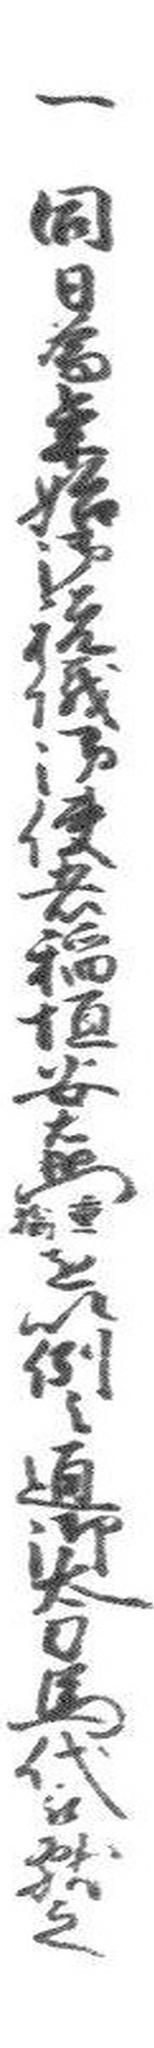一同日為年始御祝儀御使者稲垣安右衛門重猶を以例之通御太刀馬代被献之
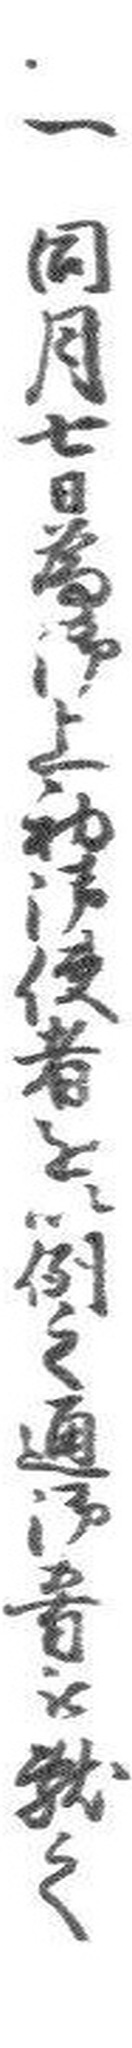一同月七日為御上初御使者を以例之通御肴被献之
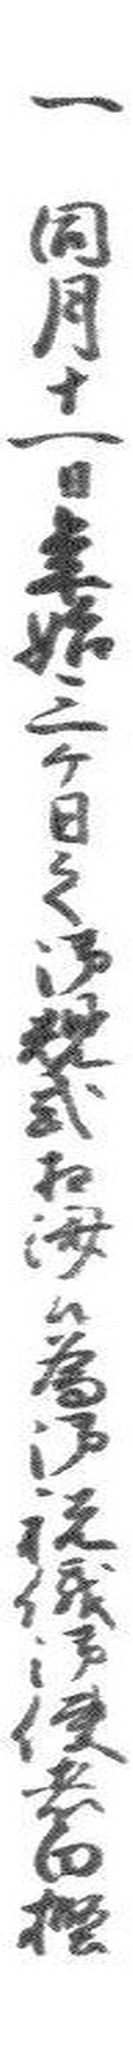一同月十一日年始三ヶ日之御規式相済候為御祝儀御使者白樫
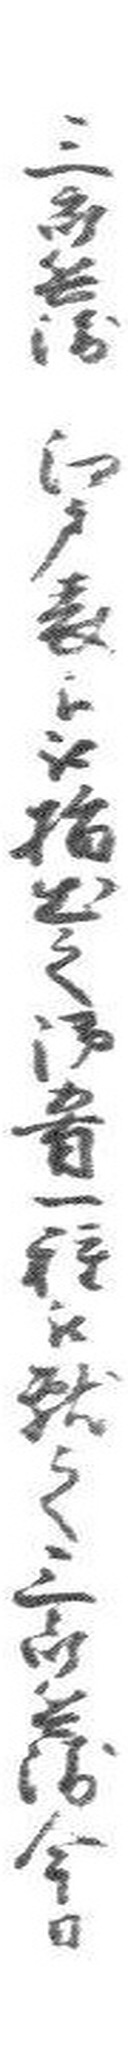三郎兵衛江戸表江被指出之御肴一種被献之三郎兵衛今日
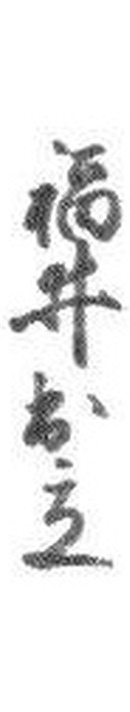福井出立
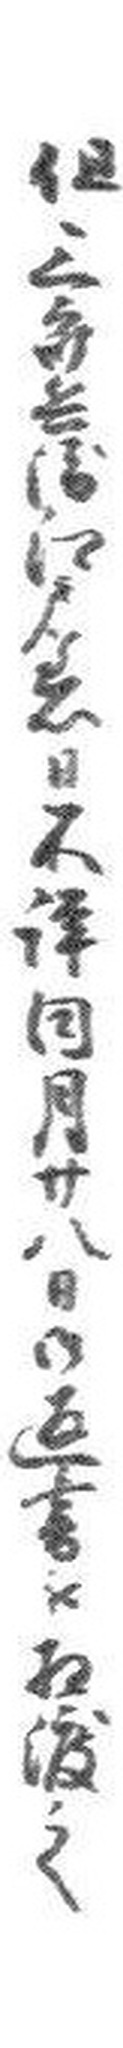但三郎兵衛江戸着日不詳同月廿八日御返書被相渡之
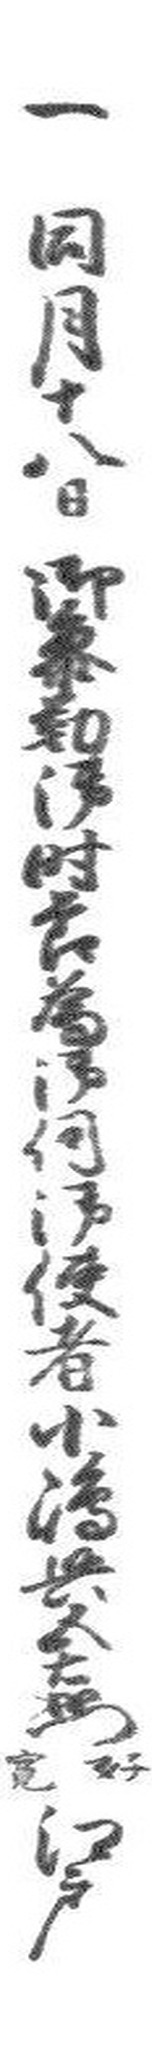一同月十八日御参勤御時節為御伺御使者小嶋与五右衛門好寛江戸

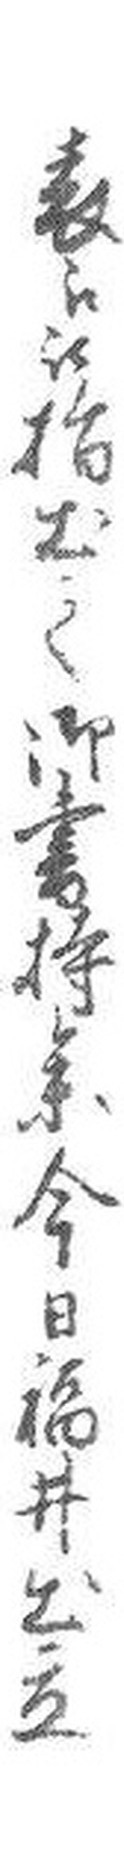表江被指出之御書持参今日福井出立
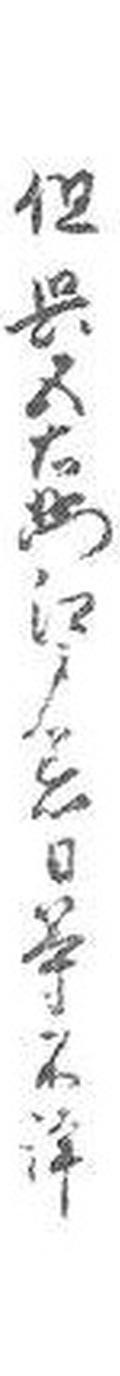但与五右衛門江戸着日等不詳
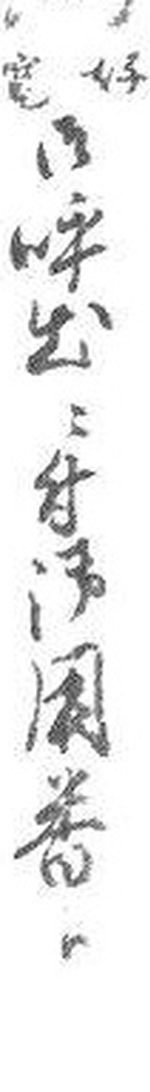寛御呼出ニ付御用番ニ
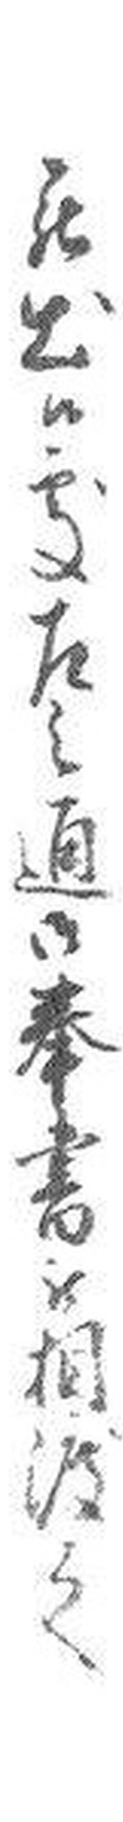罷出候処左之通御奉書被相渡之
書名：家譜 七 光通公 従寛文四年到同九年
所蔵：福井県文書館 Fukui Prefectural Archives
